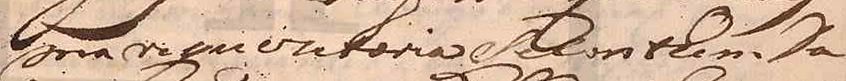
ma requizitoria se conthem Da
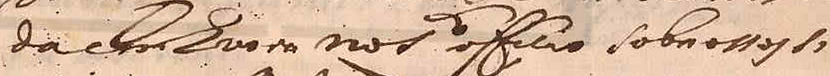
da em Evora no sto officio sob nossos si
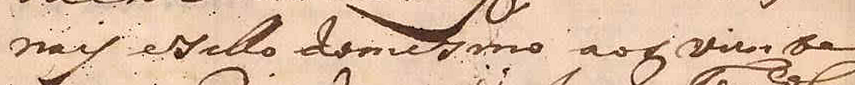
nais e sello do mesmo aos vinte
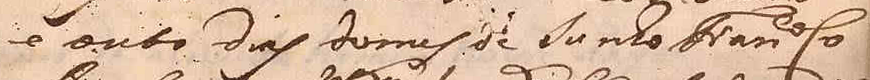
e outo dias do mes de Iunho Fran.co Co
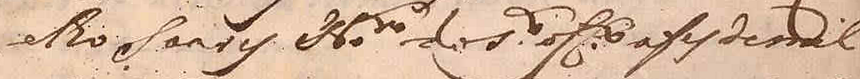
elho Soares Notro do s.to off.o a fes de mil
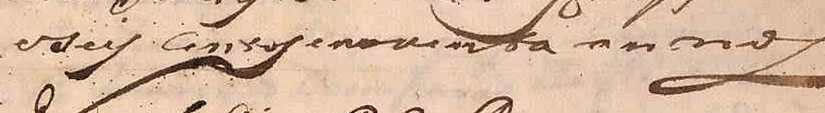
e seiscentos e nouenta annos
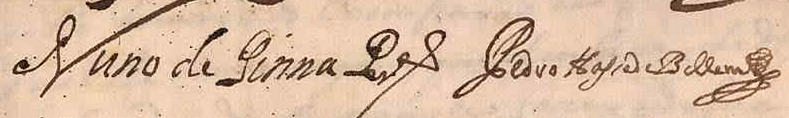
Nuno de Pinna Pera Pedro Hasse de Bellem
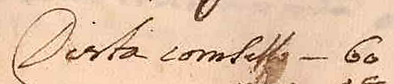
Desta com sello – 60
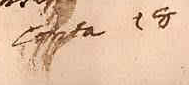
Conta 18
